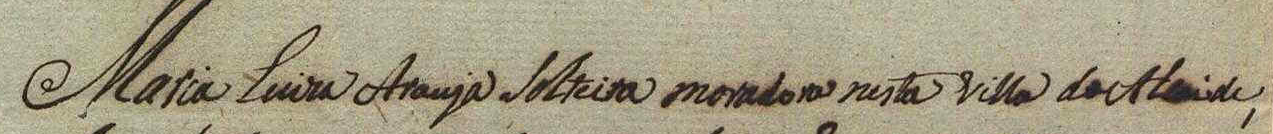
Maria Luiza Arauja Solteira moradora nesta Villa do Alcaide,
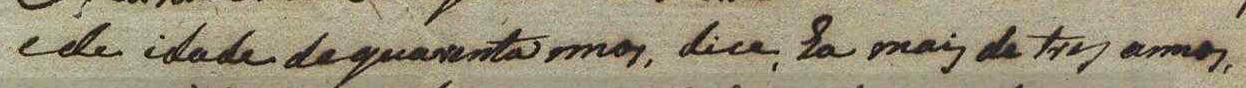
e de idade de quarenta nnos, dice, ha mais de tres annos,
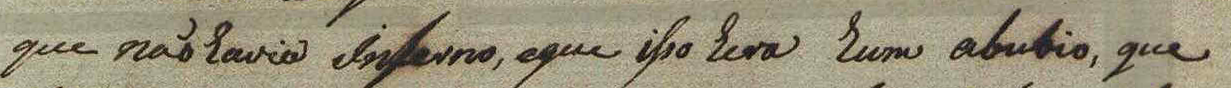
que naõ havia Inferno, e que isso hera hum abubio, que
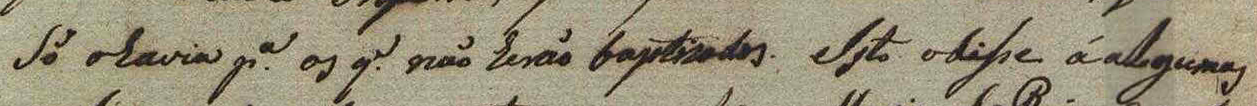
só o havia p.a os q̄. naõ heraõ baptizados. Isto o disse á algumas
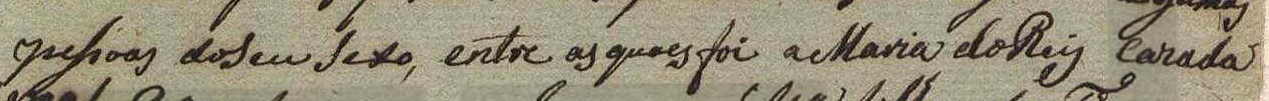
pessoas do seu sexo, entre as quaes foi a Maria do Reis cazada
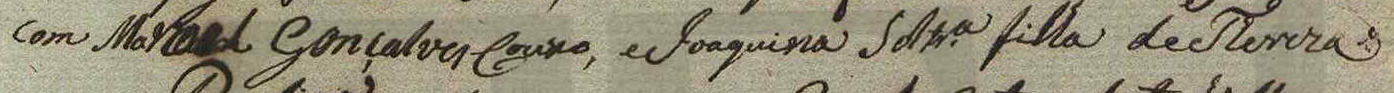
com Manoel Gonçalves Couxo, e Ioaquina Soltr.a filha de Thereza
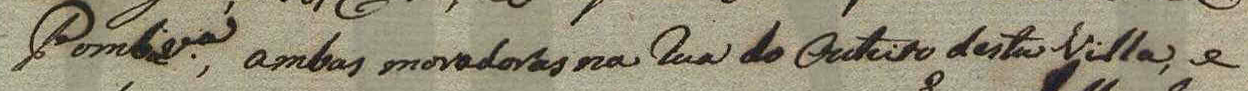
Pomba v.a, ambas moradoras na Rua do Outeiro desta Villa, e
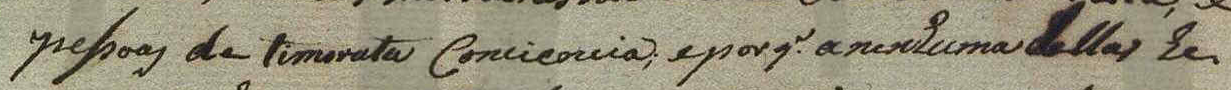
pessoas de timorata Conciencia; e porq̄. a nenhuma dellas he
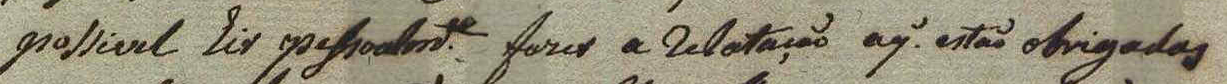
possivel hir pessoalm.te fazer a Relataçaõ a q̄ estaõ obrigadas
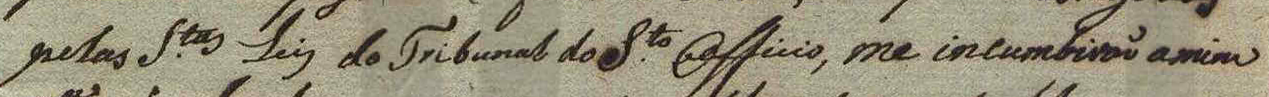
pelas S.tas Leis do Tribunal do S.to Officio, me incumbiraõ a mim
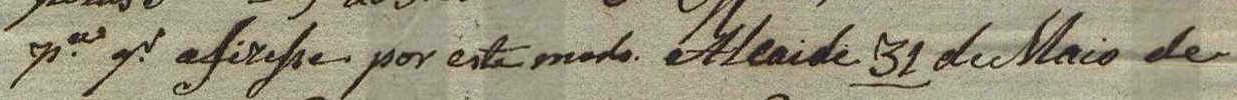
p.a q̄. a fizesse por este modo. Alcaide 31 de Maio de
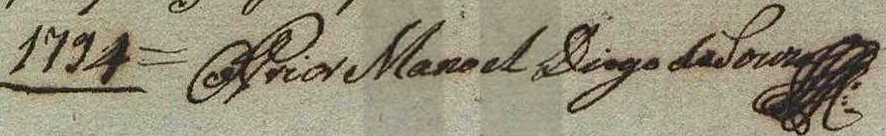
1794- O Prior Manoel Diogo da Souza
